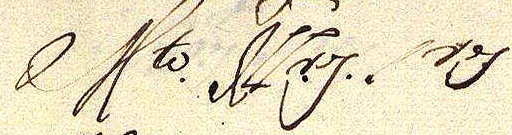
M.to Ill.res. sres
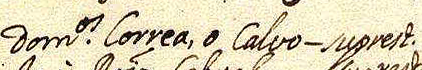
Dom.os. Correa, o Calvo - suprest.
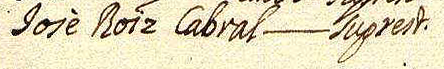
Iosé Roīz Cabral - suprest.
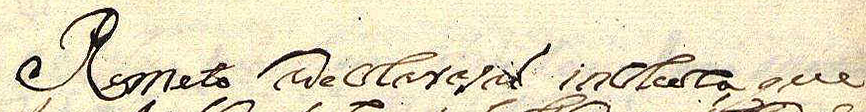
Remeto a declarasaõ inCluza que
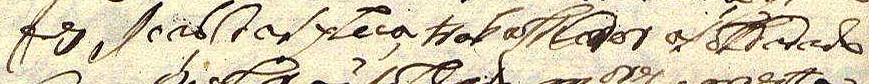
fes Joaõ da sylua trabalhador osoldadado
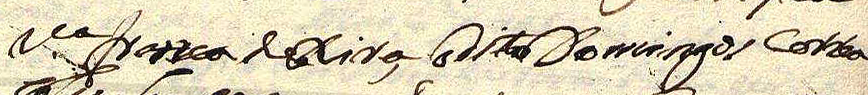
V.a franca de xira, o dito Domingos correa
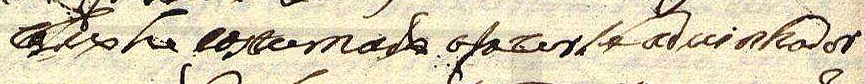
caZado he costumado o fazerse aduinhador
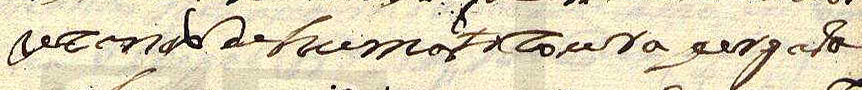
rezando de huma tazoura pergada
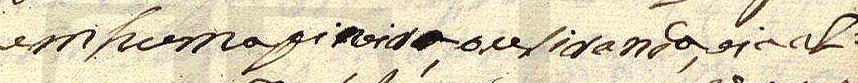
em huma privida, ou tirando sinal
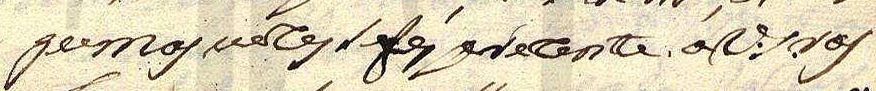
que mas uezes se fes prezente a V. s.ros
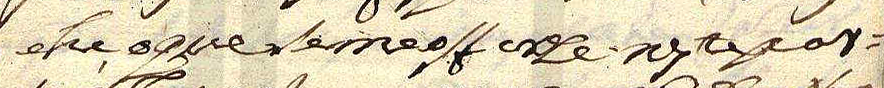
e he o que se me offerse neste par
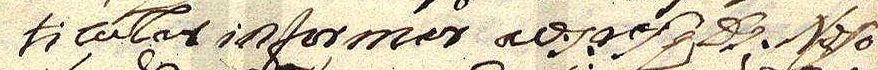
ticular informar ao sres q Ds̄. Nosso
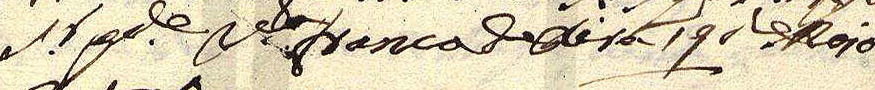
S.r gd.e V.a franca de xira, gde Maio
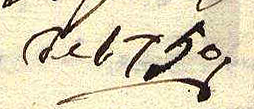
de 1750
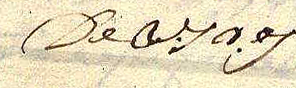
De v. sr.es
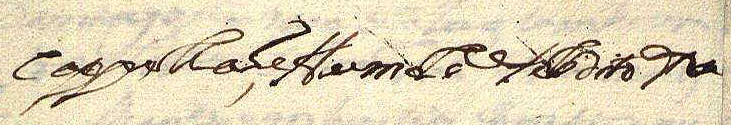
cappellaõ e Humilde subdito &a
